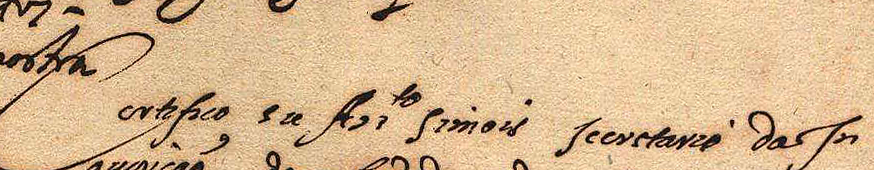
Certifico eu Anto simois secretario da Jn
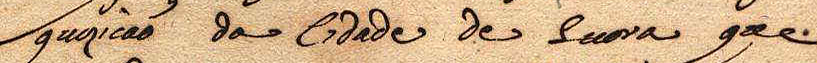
quizição da Cidade de Euora que
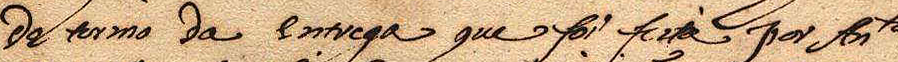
do termo da entrega que foi feita por Anto
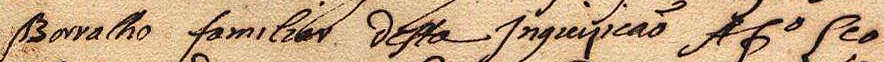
Borralho familiar desta Jnquizicão A po Lço
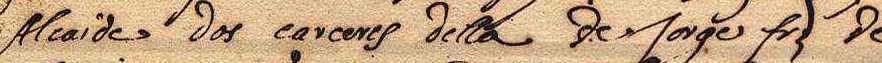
Alcaide dos carceres della de Jorge frz̅ de
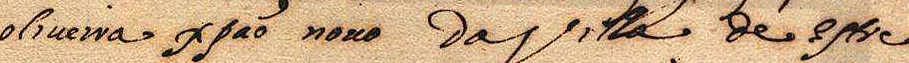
oliueira xpão nouo da Villa de Estre
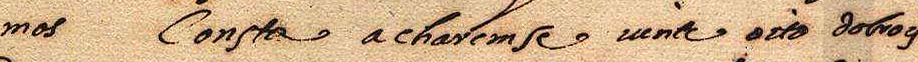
mos Consta acharemse uinte oito dobrois
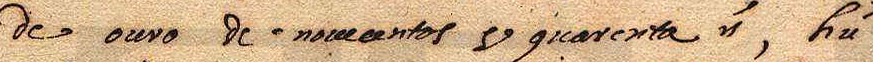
de ouro de nouecentos E quarenta rs̅, hu̅
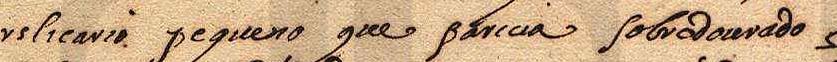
relicario pequeno que parecia sobredourado E
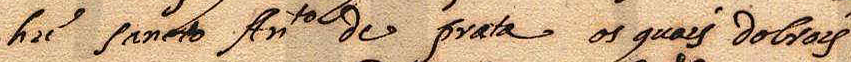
hu̅ sancto Anto de prata os quais dobrois
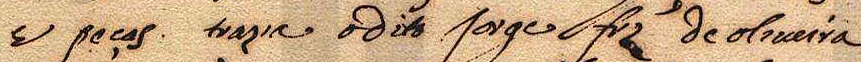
E peças trazia o dito Jorge frz̅ de oliueira
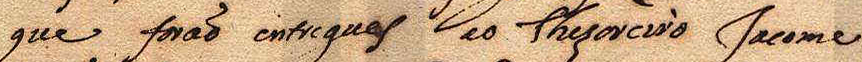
que foraõ entregues ao Thezoreiro Jacome
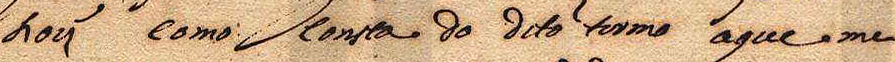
Roiz̅ como consta do dito termo a que me
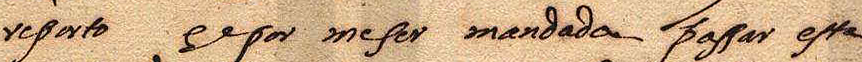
reporto E por me ser mandada passar esta
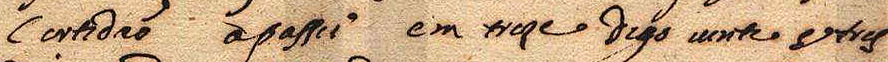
certidão a passei em treze digo uinte E tres
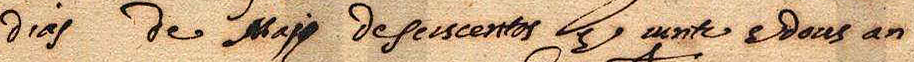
dias de Majo de seiscentos E uinte E dous an
